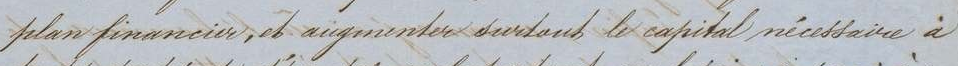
plan financier, et augmenter surtout le capital nécessaire à
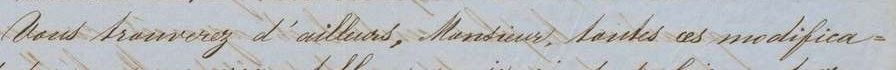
Vous trouverez d'ailleurs, Monsieur, toutes ces modifica-
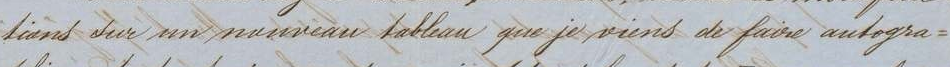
tions sur un nouveau tableau que je viens de faire autogra-
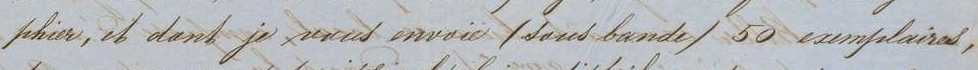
phier, et dont je vous envoie (sous bande) 50 exemplaires,
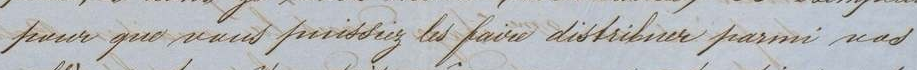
pour que vous puissiez les faire distribuer parmi vos
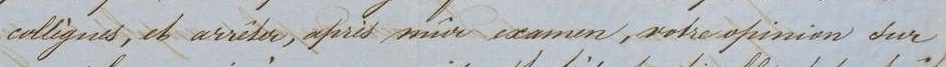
collègues, et arrêter, après mûr examen, votre opinion sur
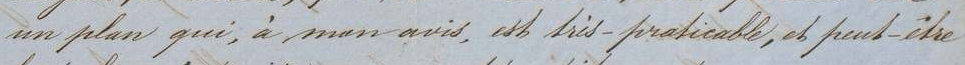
un plan qui, à mon avis, est très-praticable, et peut-être
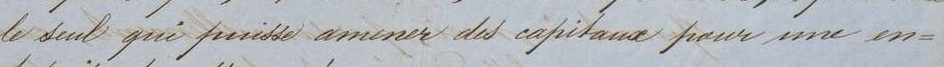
le seul qui puisse amener des capitaux pour une en-
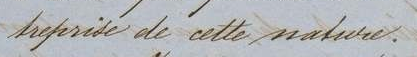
treprise de cette nature.
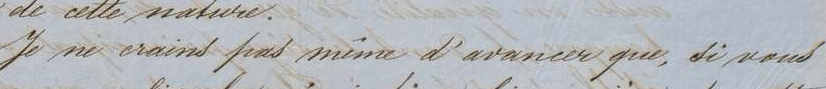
Je ne crains pas même d'avancer que, si vous
